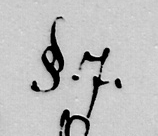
§. 7.
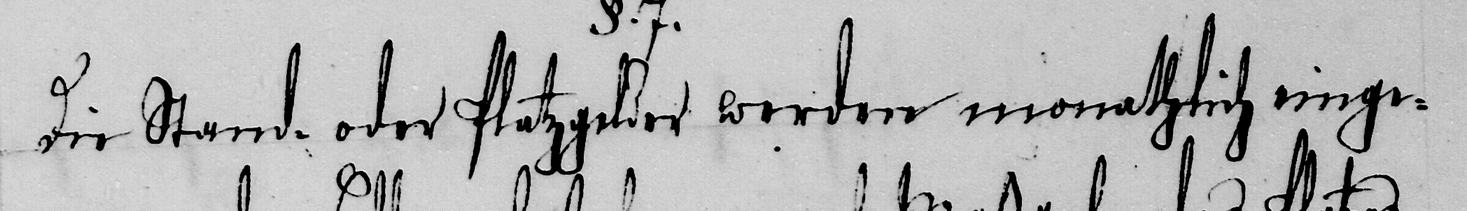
Die Stand- oder Platzgelder werden monathlich einge¬
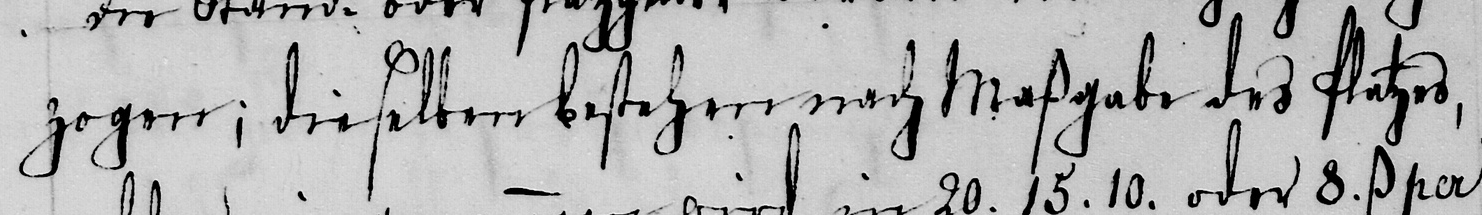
zogen; dieselben bestehen nach Maßgabe des Platzes,
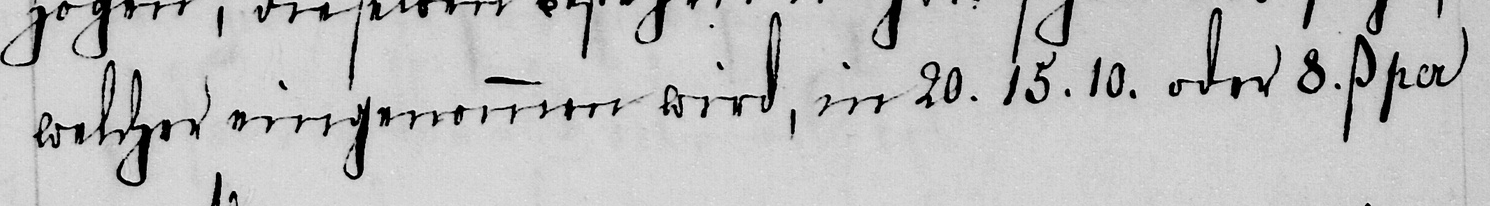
welcher eingenommen wird, in 20. 15. 10. oder 8. ß. per
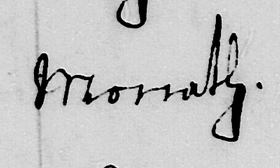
Monath.
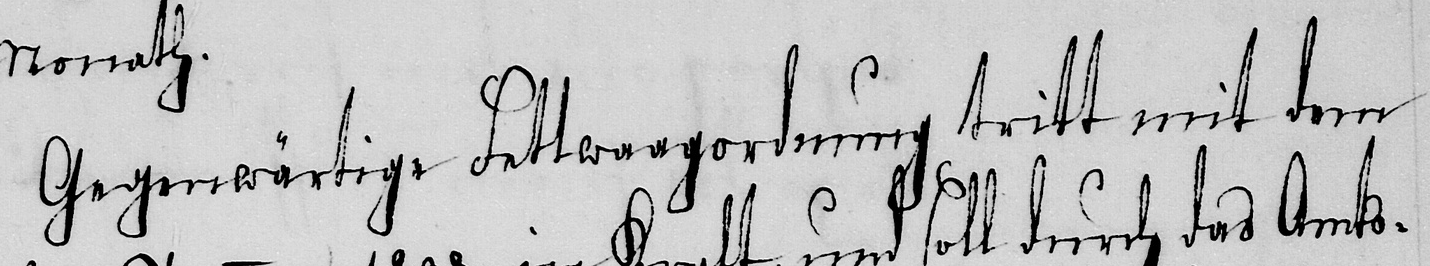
Gegenwärtige Fettwaagordnung tritt mit dem
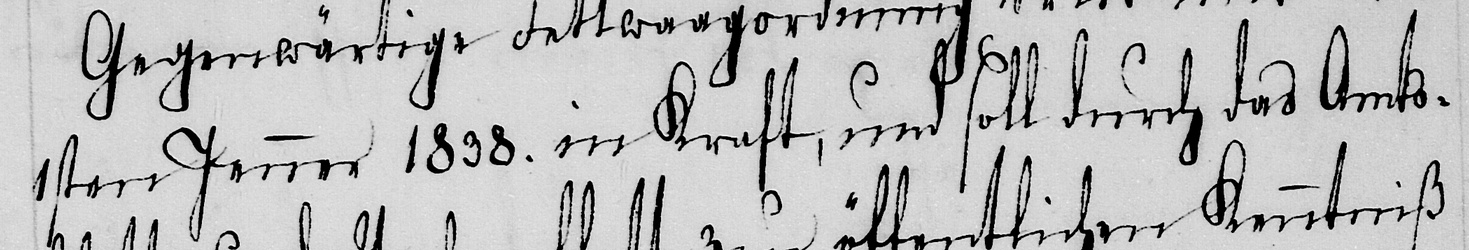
1sten Jenner 1838. in Kraft, und soll durch das Amts¬
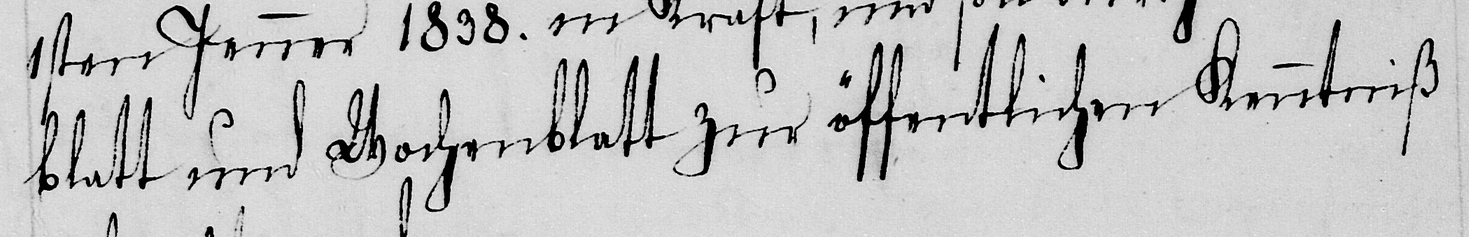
blatt und Wochenblatt zur öffentlichen Kenntniß
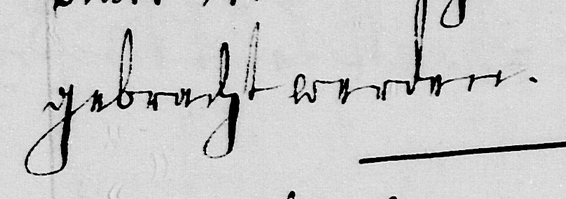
gebracht werden.
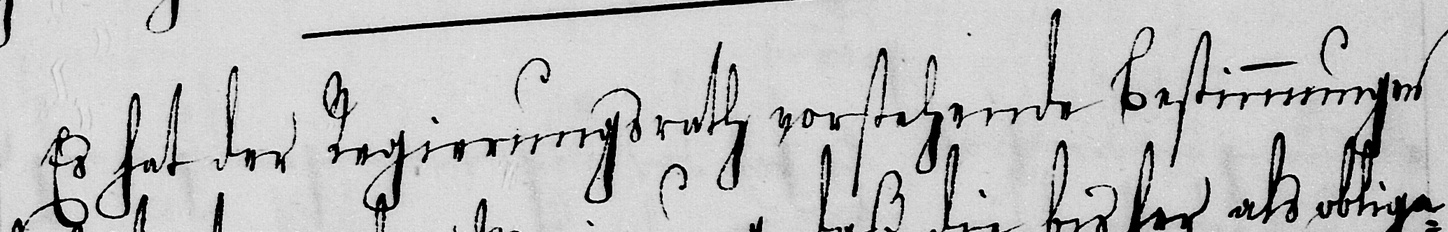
Es hat der Regierungsrath vorstehende Bestimmungen
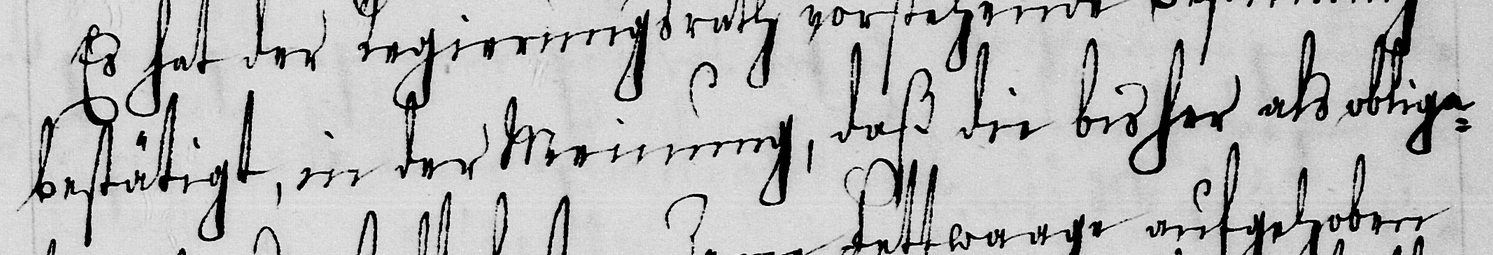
bestätigt, in der Meinung, daß die bisher als oblig¬
